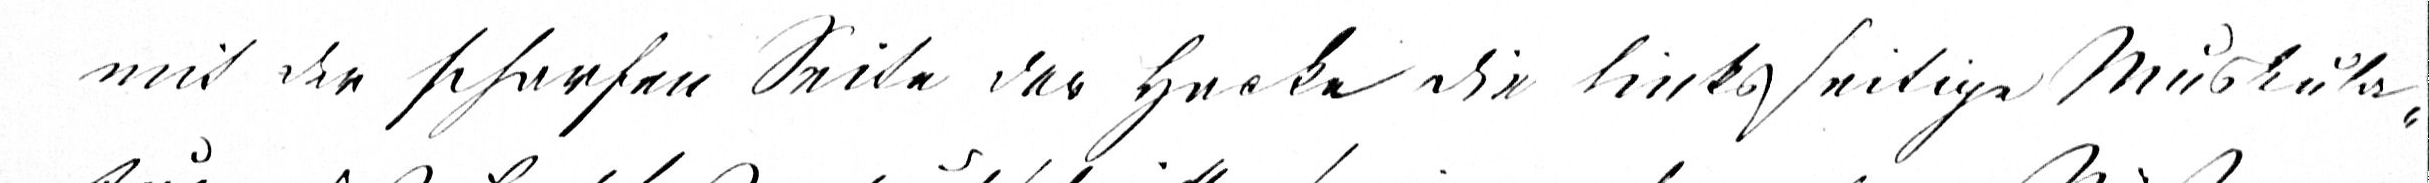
mit der scharfen Seite der Hacke die linksseitige Muskula¬
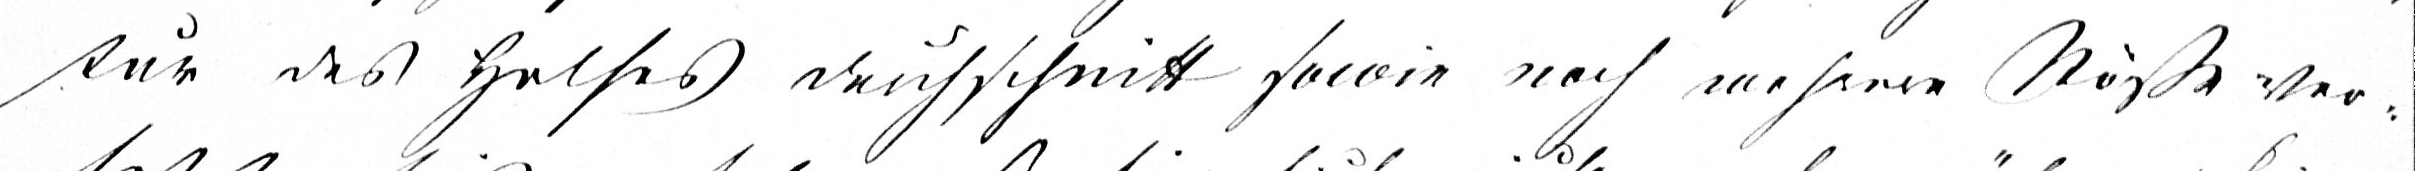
tur des Halses Deichschnitt sowie noch mehrere Nöße ver¬
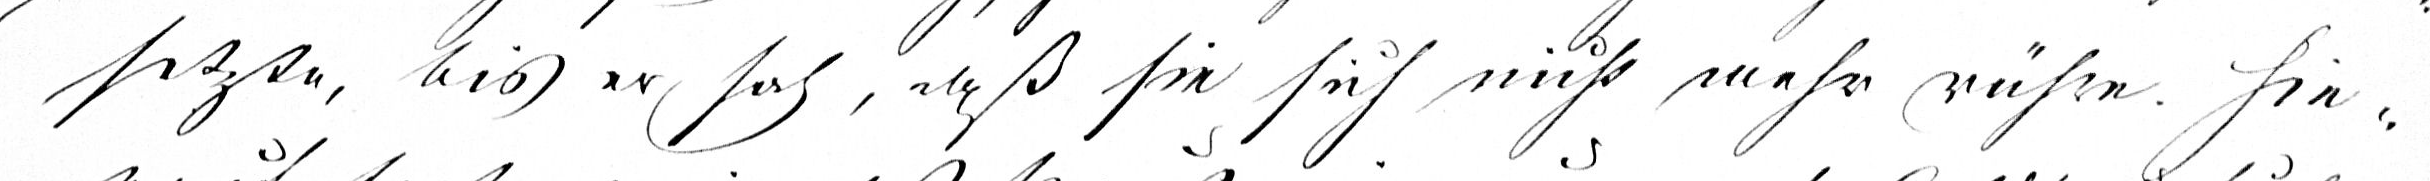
setzte, bis er sah, daß sie sich nicht mehr rühre. Hie¬
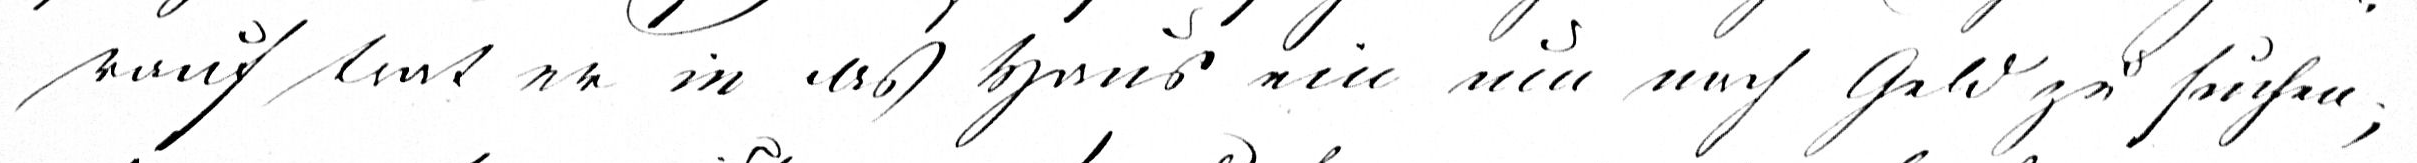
rauf trat er in das Haus ein um nach Geld zu suchen;
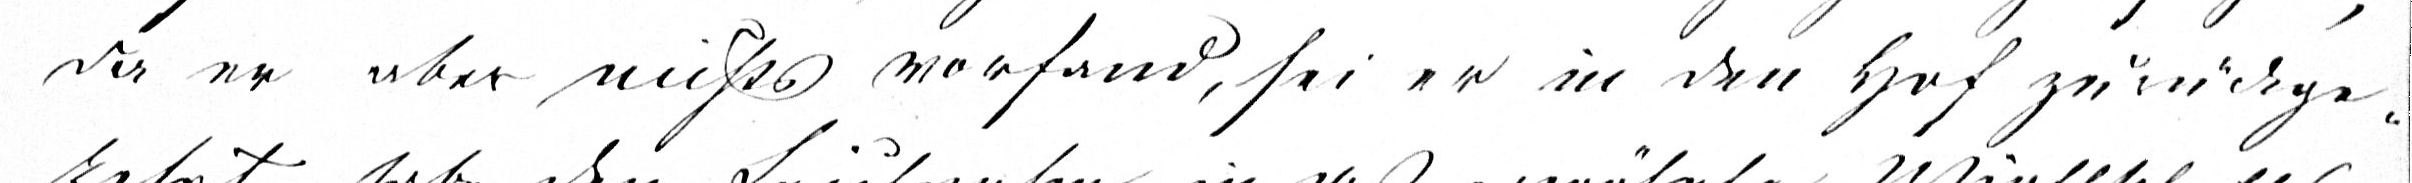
da er aber nichts vorfand, sei er in den Hof zurückge¬
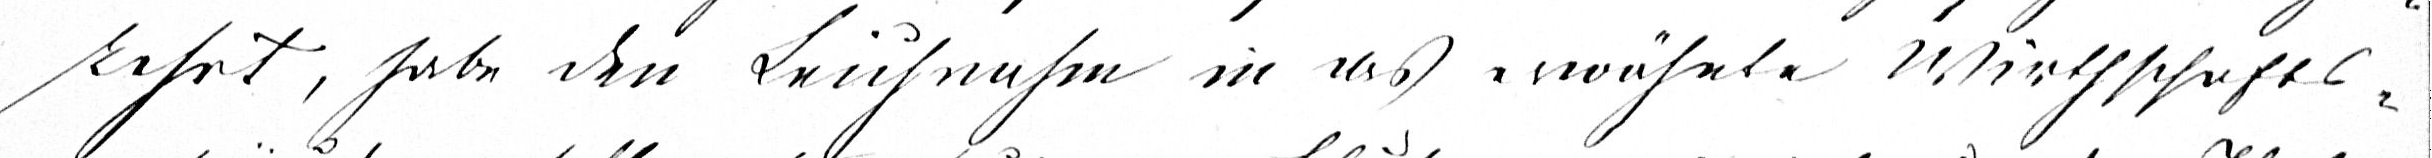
kehrt, habe den Leichnahm in das erwöxxte Wirthschafts¬
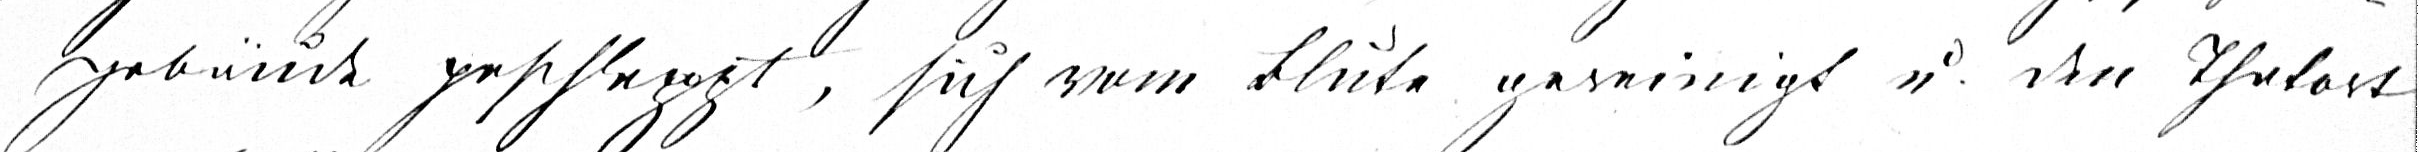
gebäude geschleppt, sich vom Blute gereinigt u. den Thatort
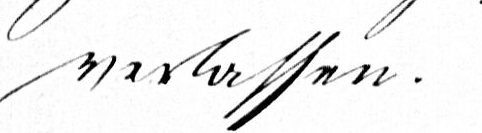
verlassen.
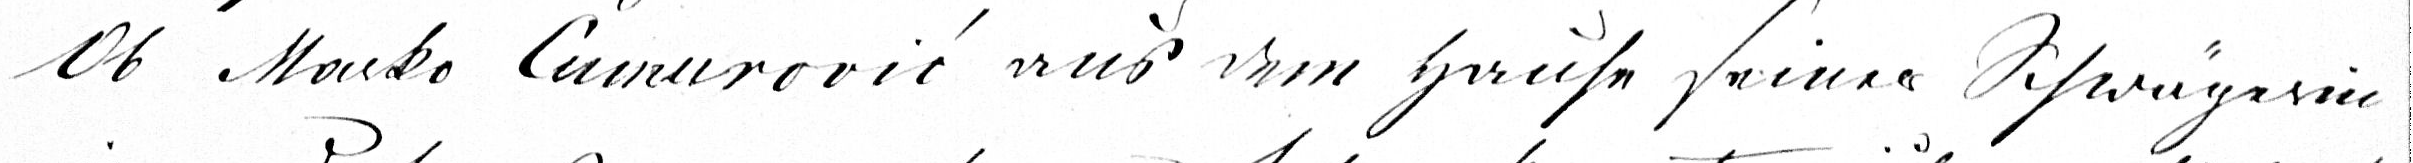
Ob Marko Cumurović aus dem Hause seiner Schwägerin
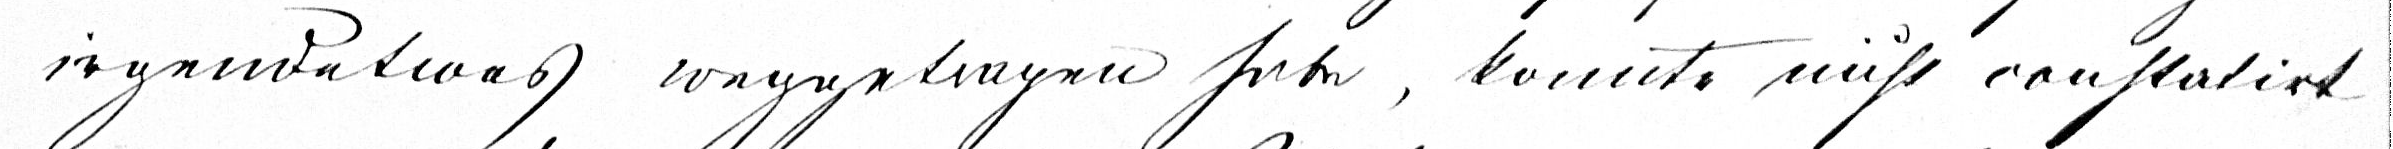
irgend etwas weggetragen habe, konnte nicht constatirt
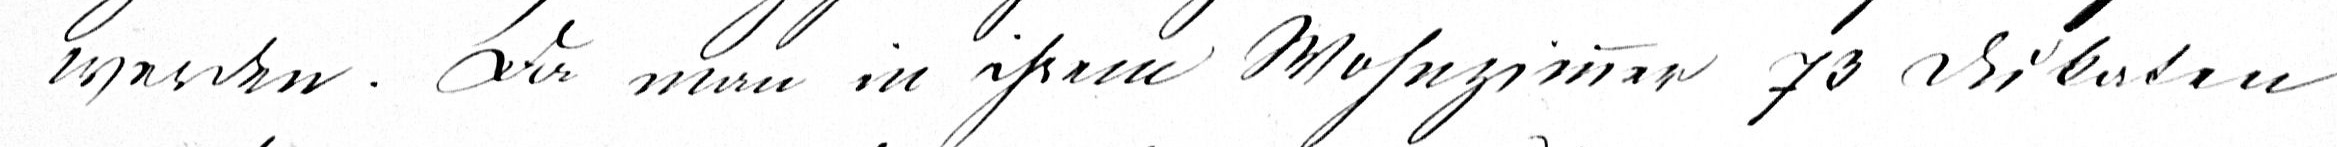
werden. Da man in ihrem Wohnzimmer 73 Dukaten
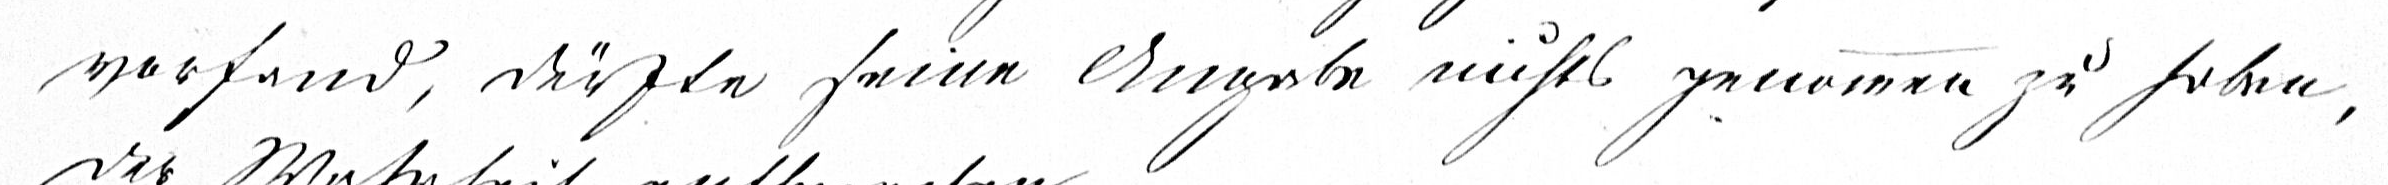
vorfand, dürfte seine Angabe nichts genommen zu haben,
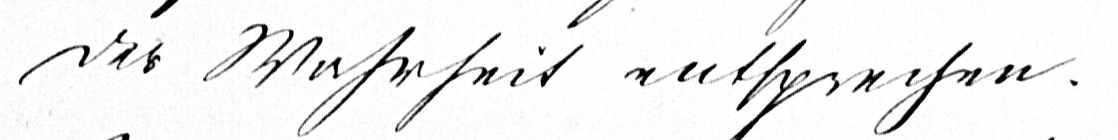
des Wahrheit entsprechen.
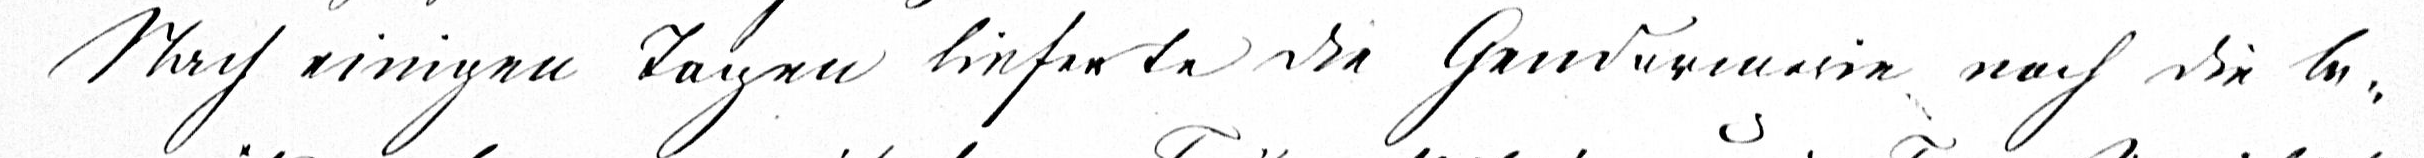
Nach einigen Tagen lieferte die Gendarmerie nach die be¬
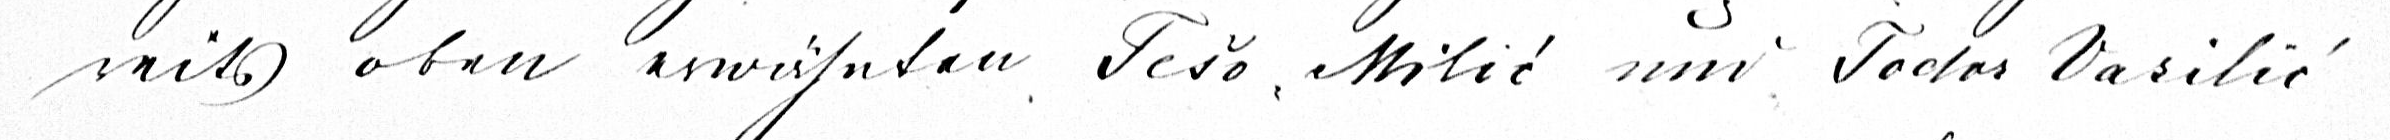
reits oben erwähnten Tešo, Milić und Todor Vasilić
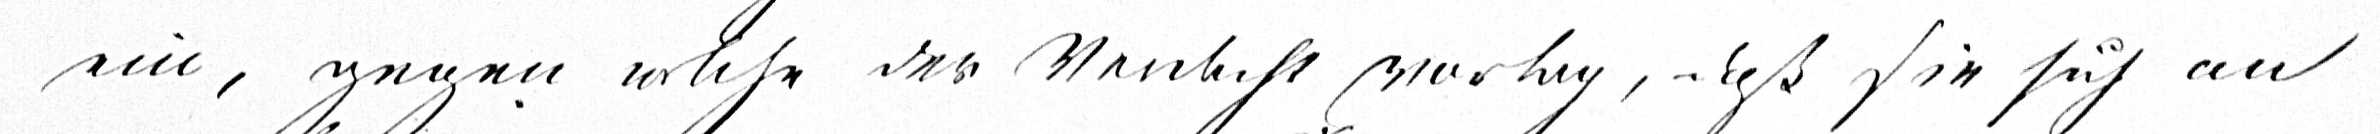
ein, gegen welche der Verdacht vorlag, daß sie sich an
